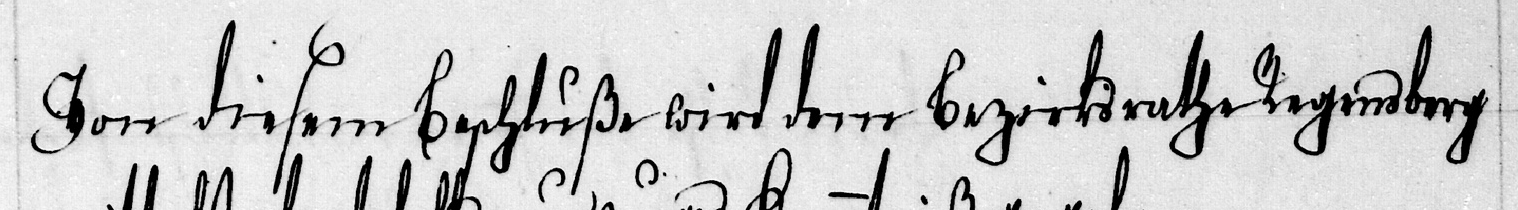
Von diesem Beschluße wird dem Bezirksrathe Regensberg
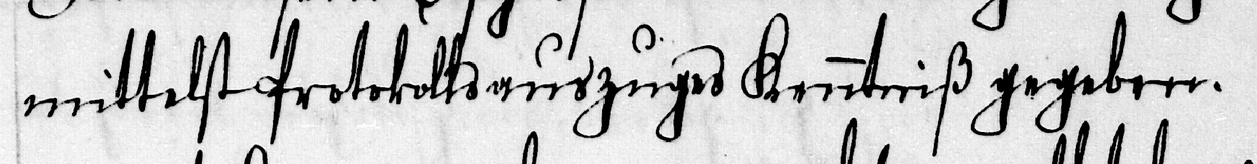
mittelst Protokollsauszuges Kenntniß gegeben.
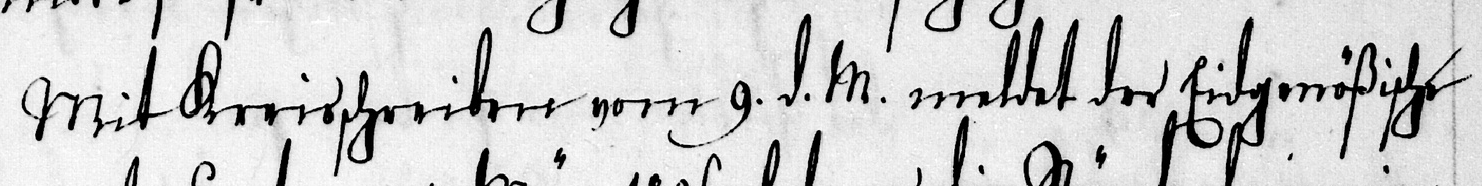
Mit Kreisschreiben vom 9. d. M. meldet der Eidgenößische
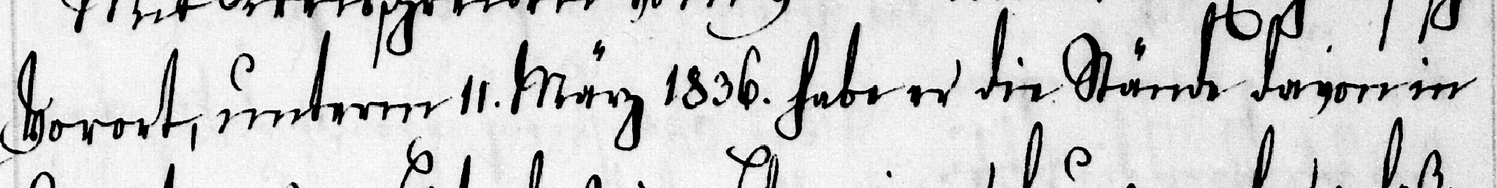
Vorort, unterm 11. März 1836. habe er die Stände davon in
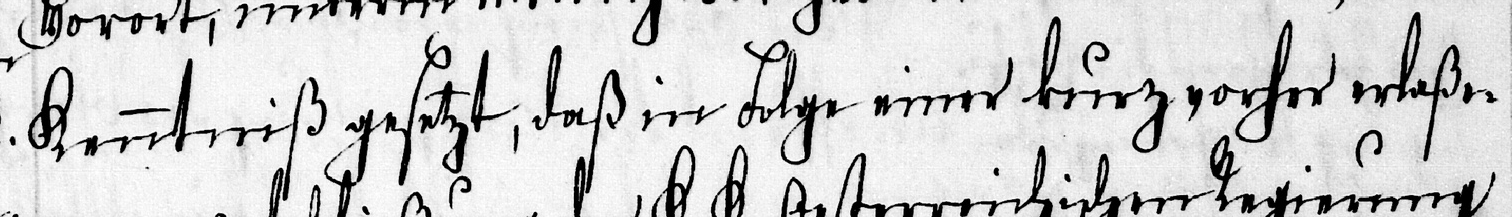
Kenntniß gesetzt, daß in Folge einer kurz vorher erlaße¬
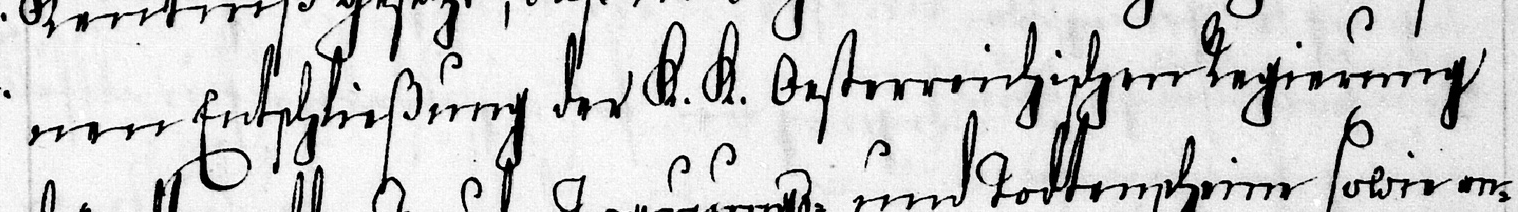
nen Entschließung der K. K. Oesterreichischen Regierung
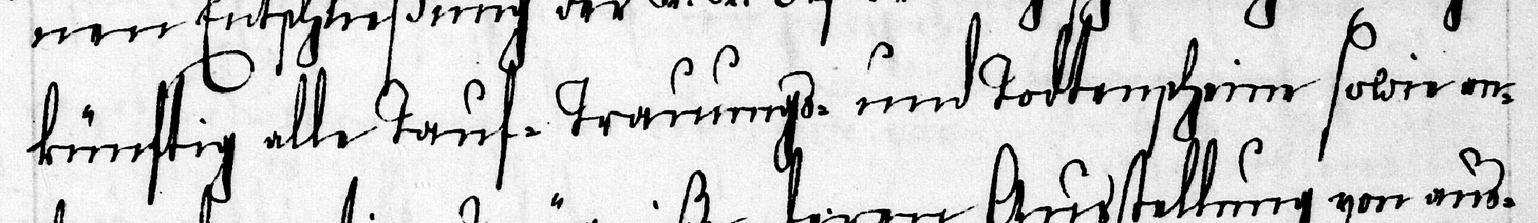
künftig alle Tauf- Trauungs- und Todtenscheine sowie an¬
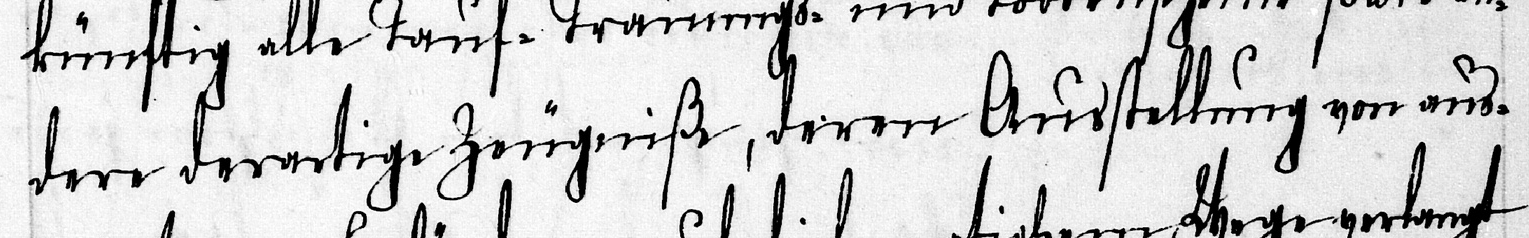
dere derartige Zeugniße, deren Ausstellung von aus¬
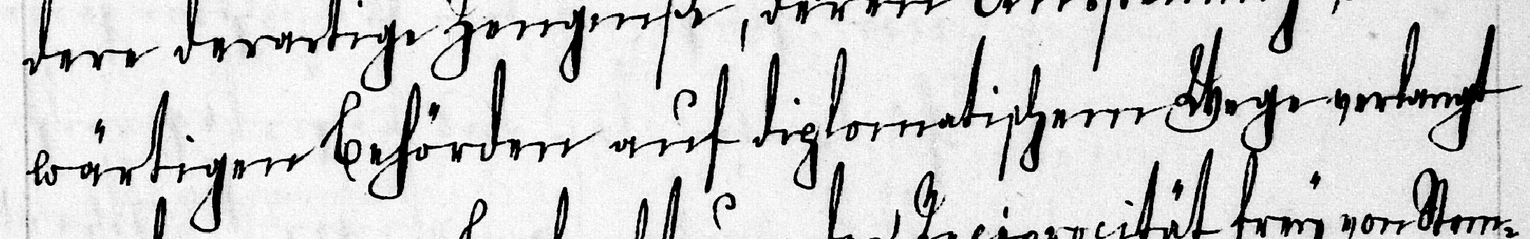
wärtigen Behörden auf diplomatischem Wege verlangt
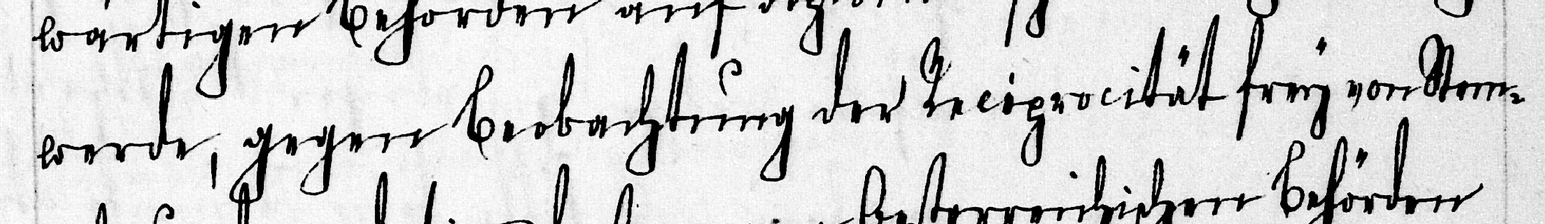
werde, gegen Beobachtung der Reciprocität frey von Stem¬
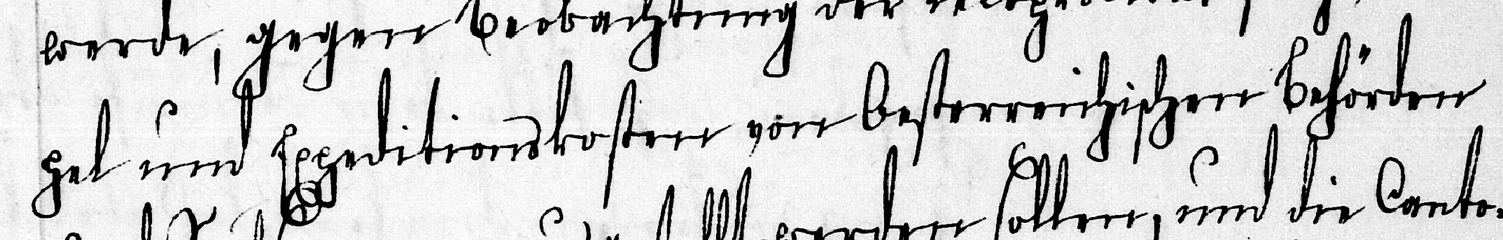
pel und Expeditionskosten von Oesterreichischen Behörden
